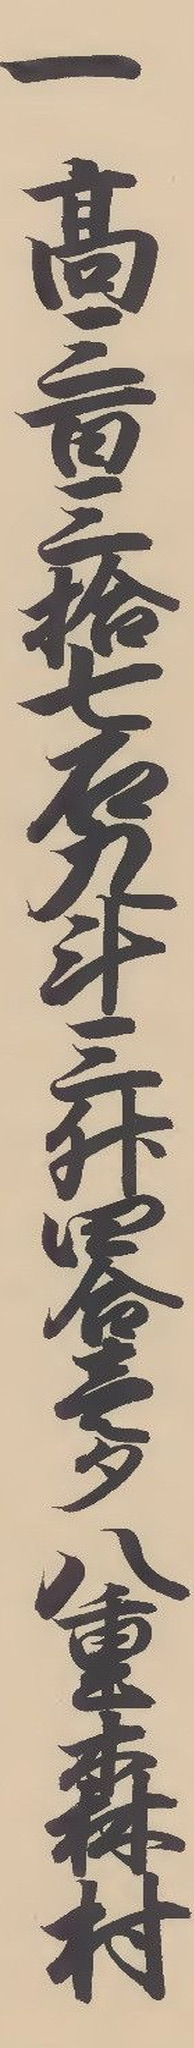一高三百三拾七石九斗三升四合壱勺八重森村
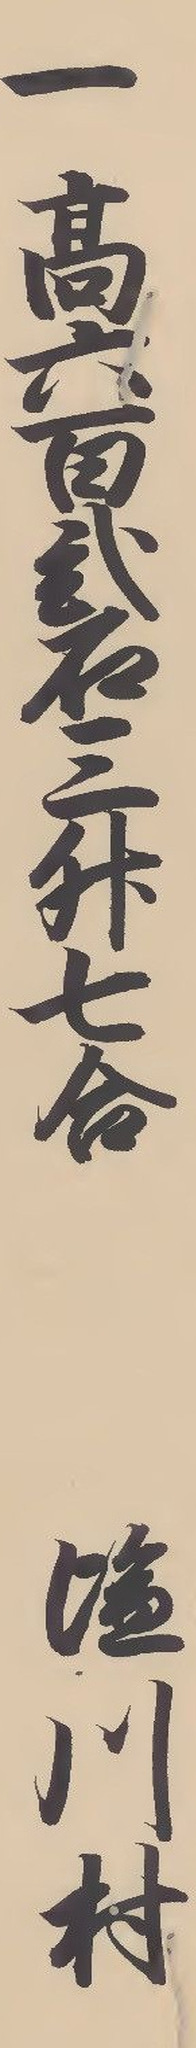一高六百弐石三升七合塩川村
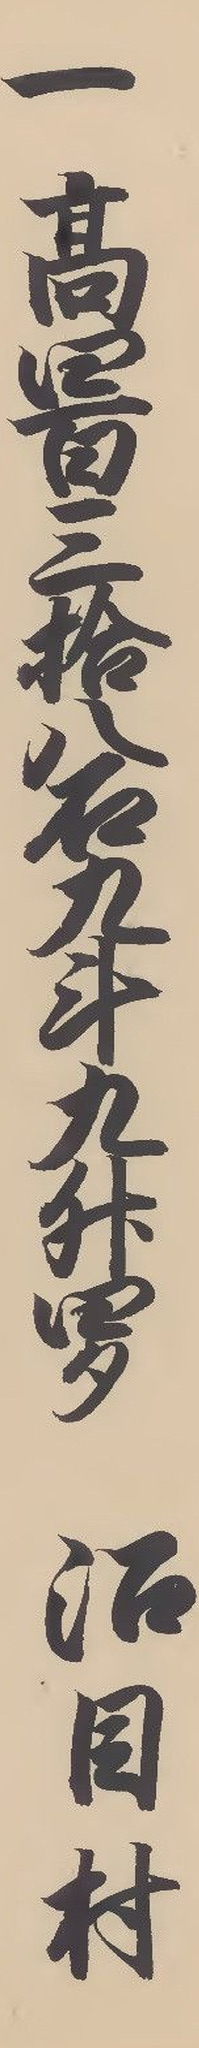一高四百三拾八石九斗九升四勺沼目村
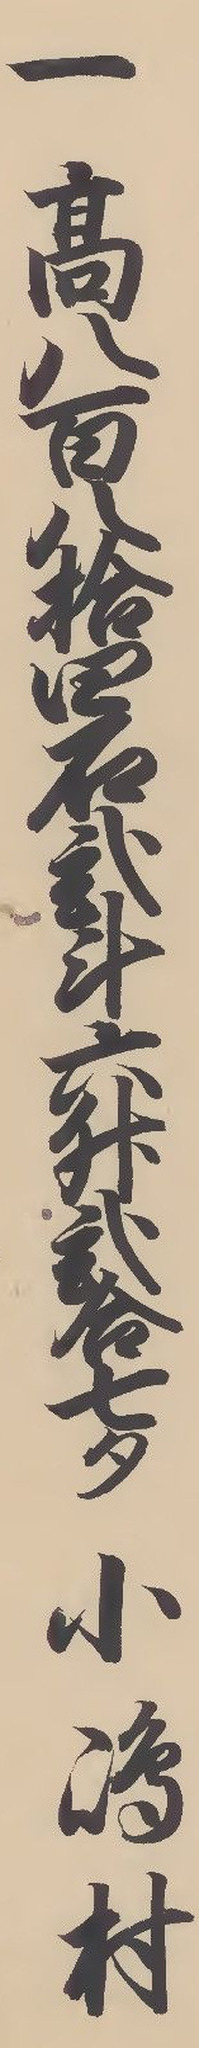一高八百八拾四石弐斗六升弐合七勺小島村

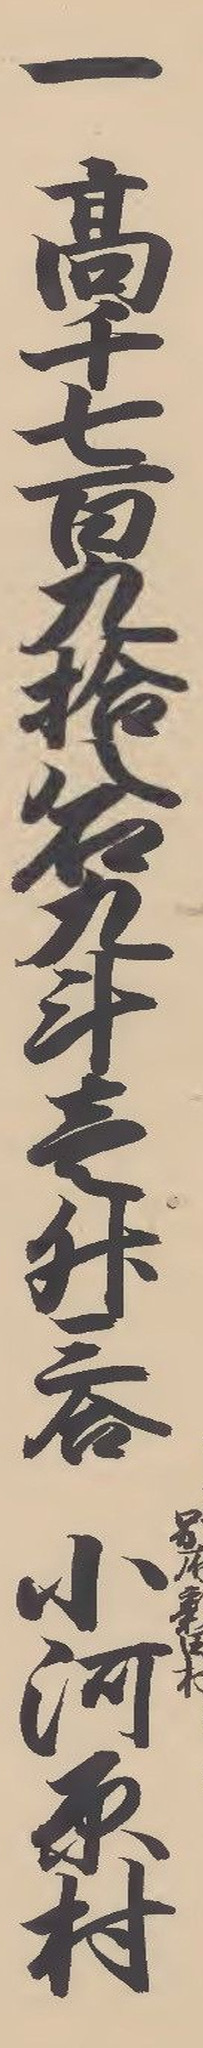一高千七百九拾八石九斗壱升三合小河原村
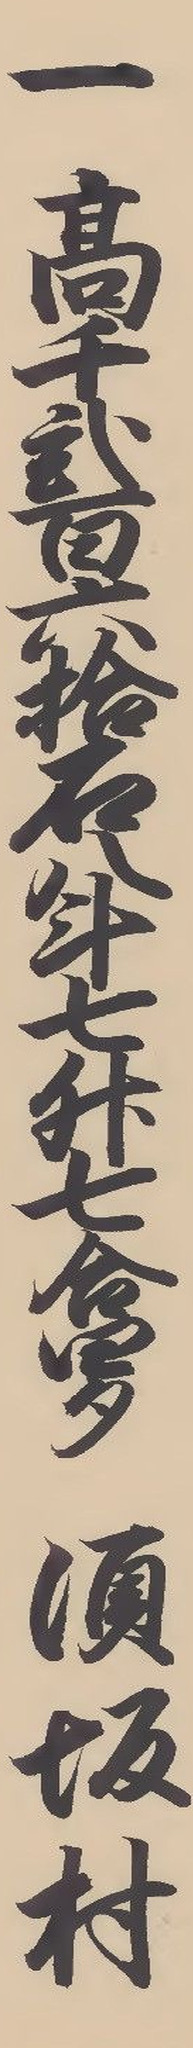一高千弐百六拾石八斗七升七合四勺須坂村
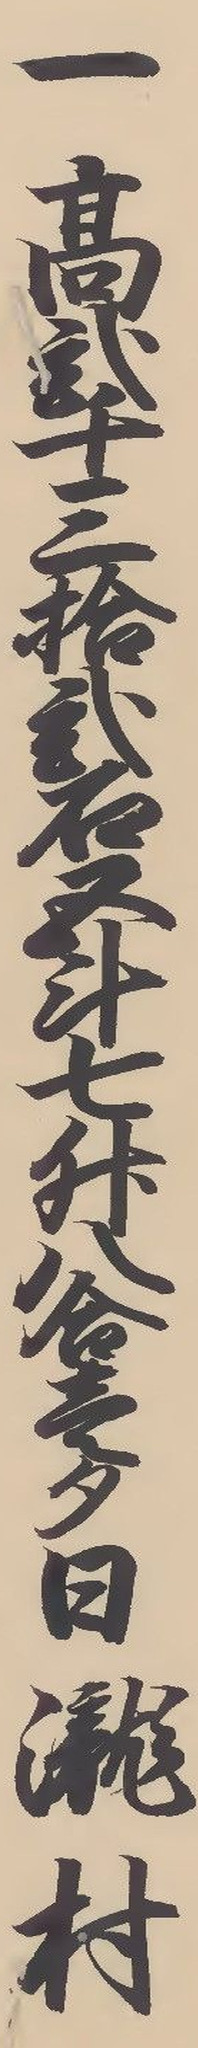一高弐千三拾弐石五斗七升八合壱勺日滝村
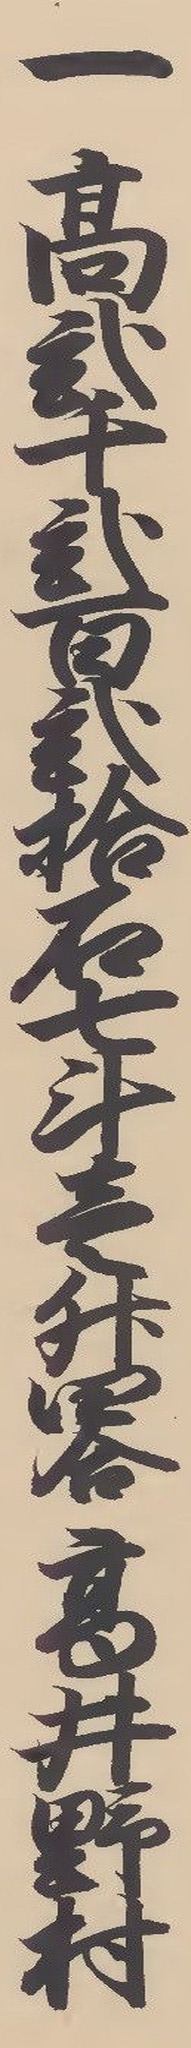一高弐千弐百弐拾石七斗壱升四合高井野村
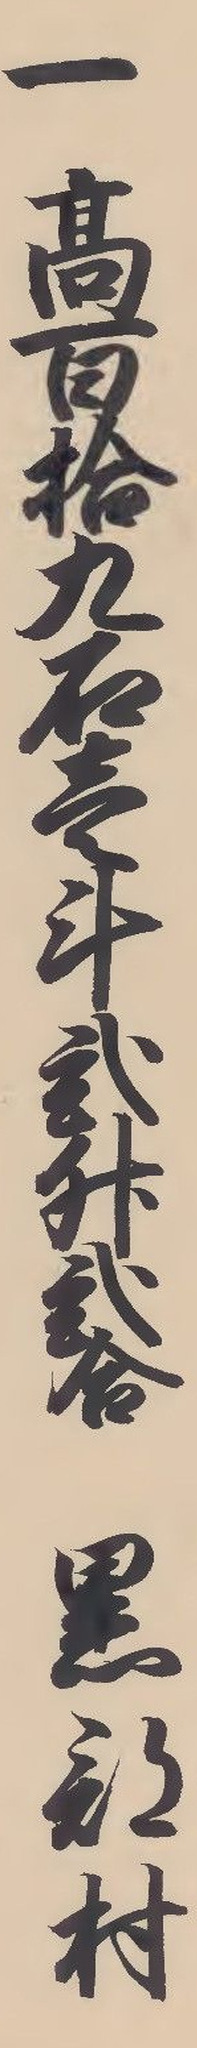一高百拾九石壱斗弐升弐合黒部村
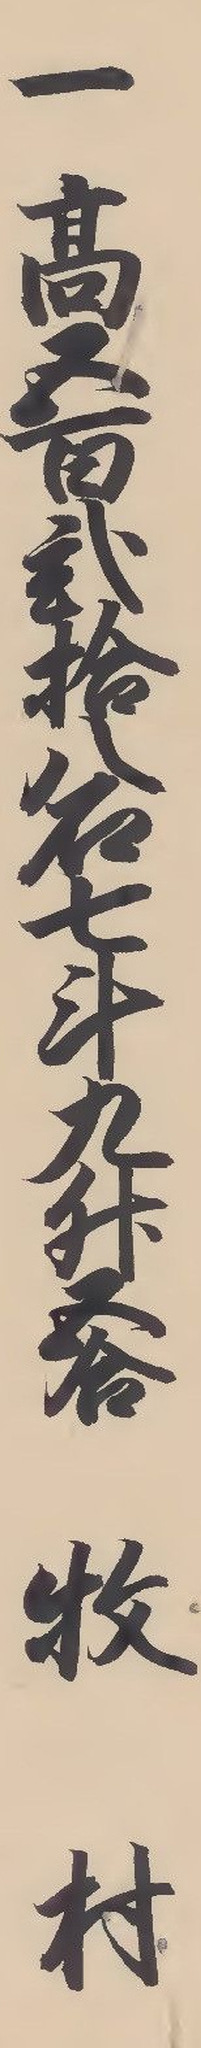一高五百弐拾八石七斗九升五合牧村
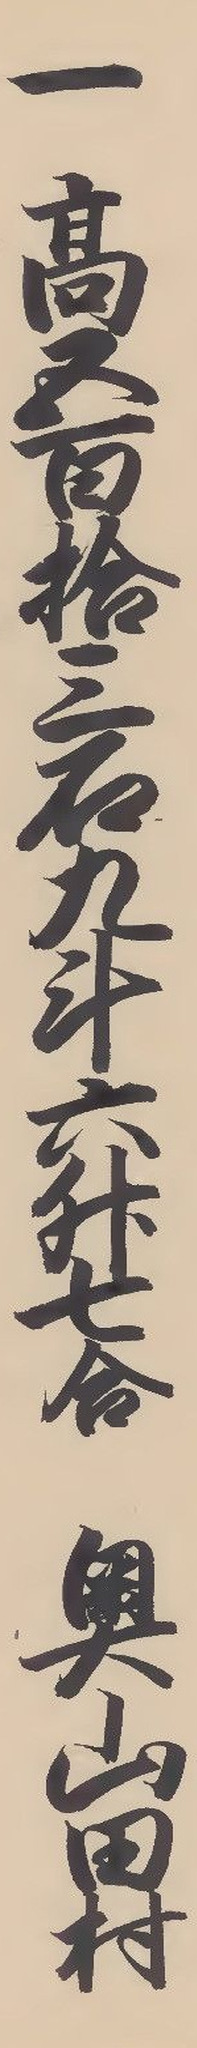一高五百拾三石九斗六升七合奥山田村
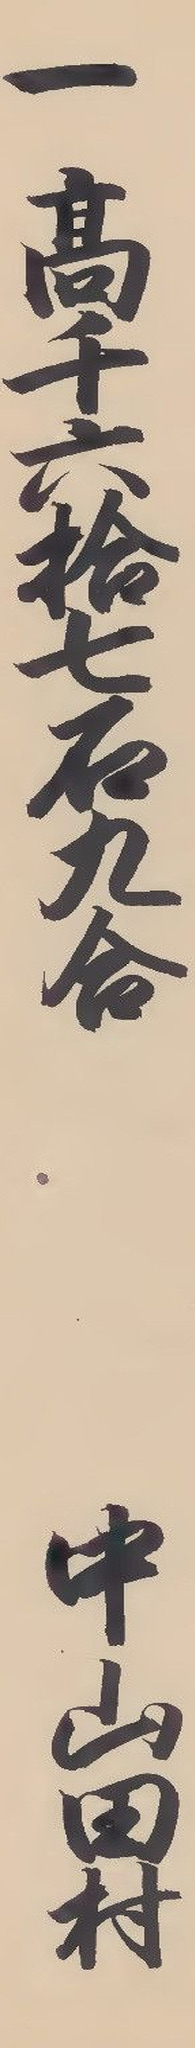一高千六拾七石九合中山田村

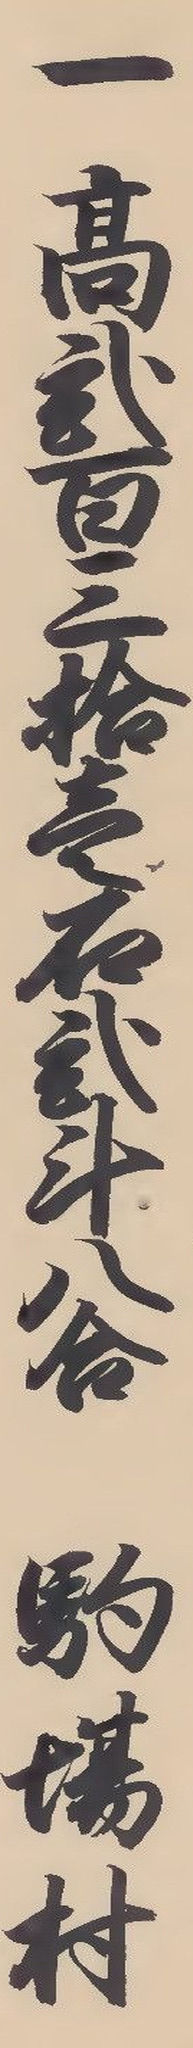一高弐百三拾壱石弐斗八合駒場村
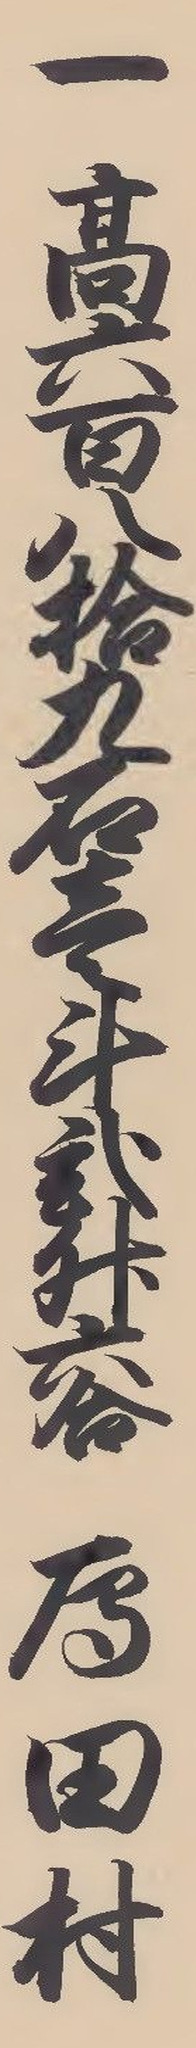一高六百八拾九石壱斗弐升六合雁田村
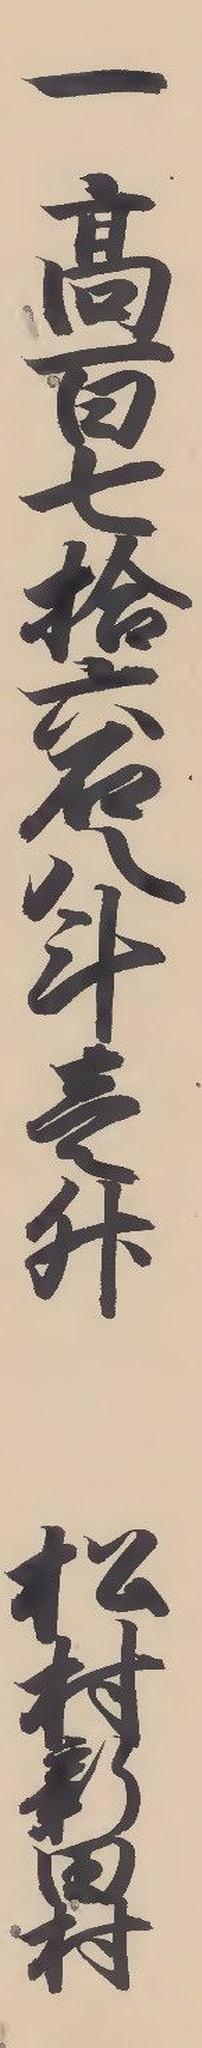一高百七拾六石八斗壱升松村新田村
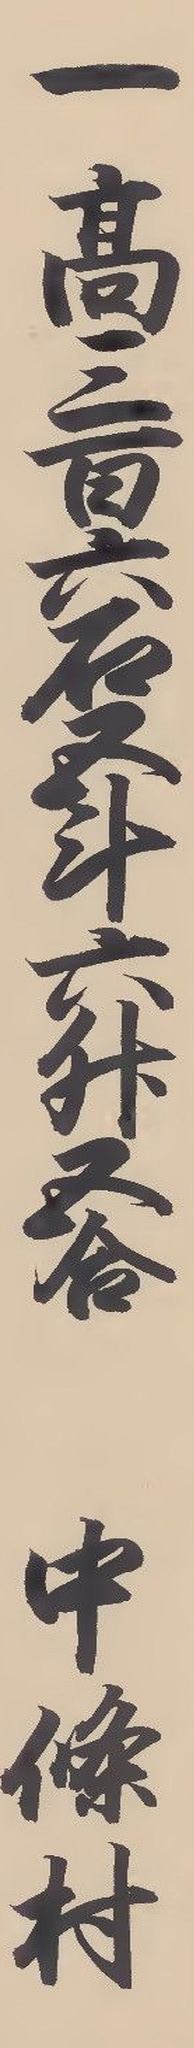一高三百六石五斗六升五合中条村
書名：信濃国郷帳
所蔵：国立公文書館 National Archives of Japan
